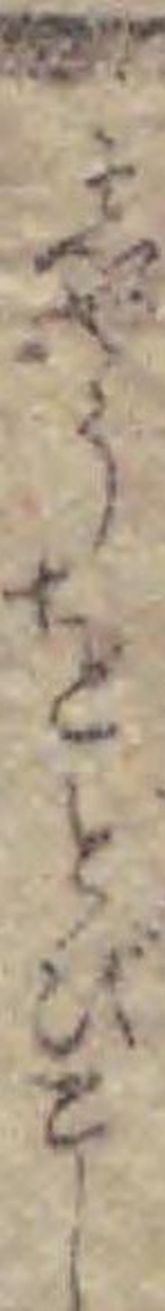しやうをとびこし
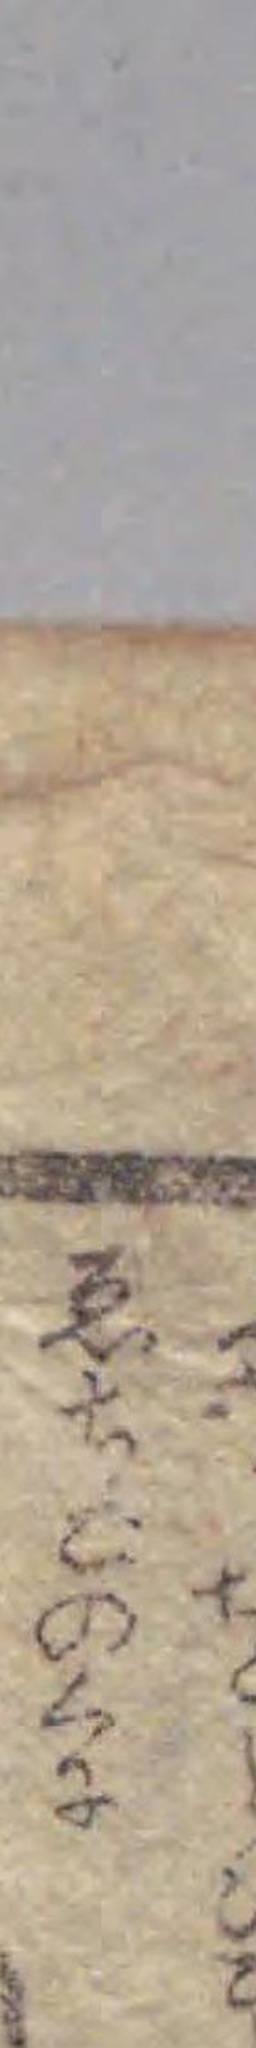ゑちごのくに
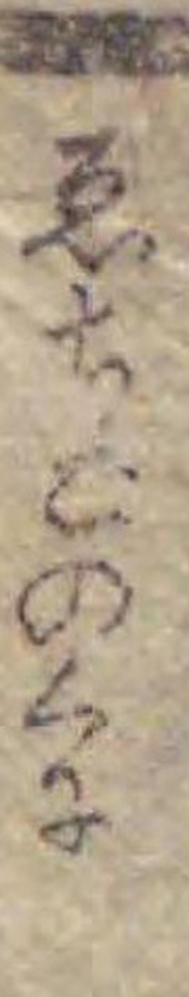ゑちごのくに
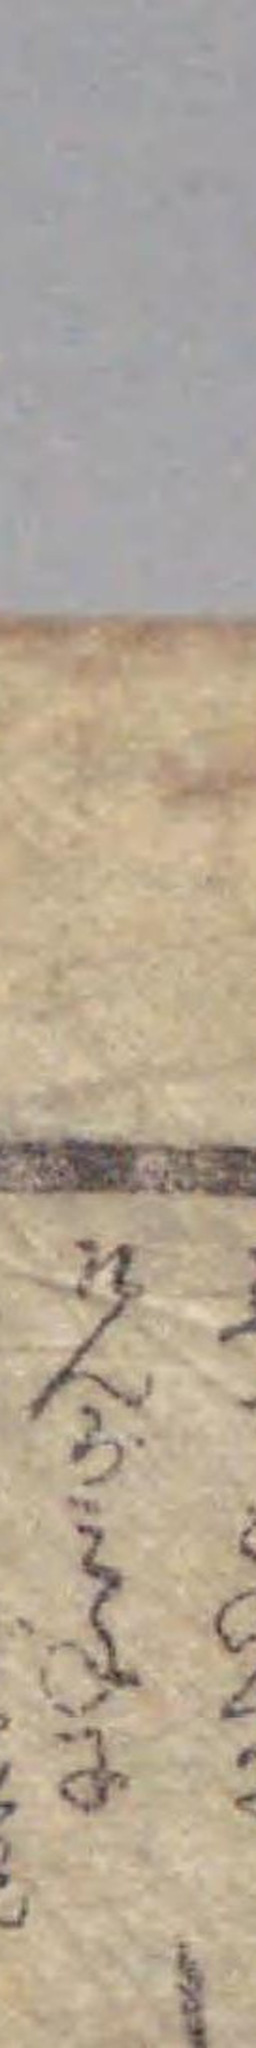けんかみねに
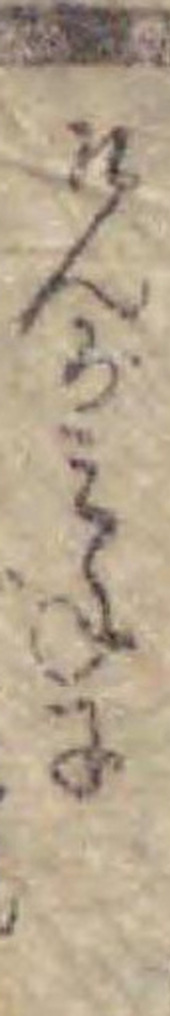けんかみねに
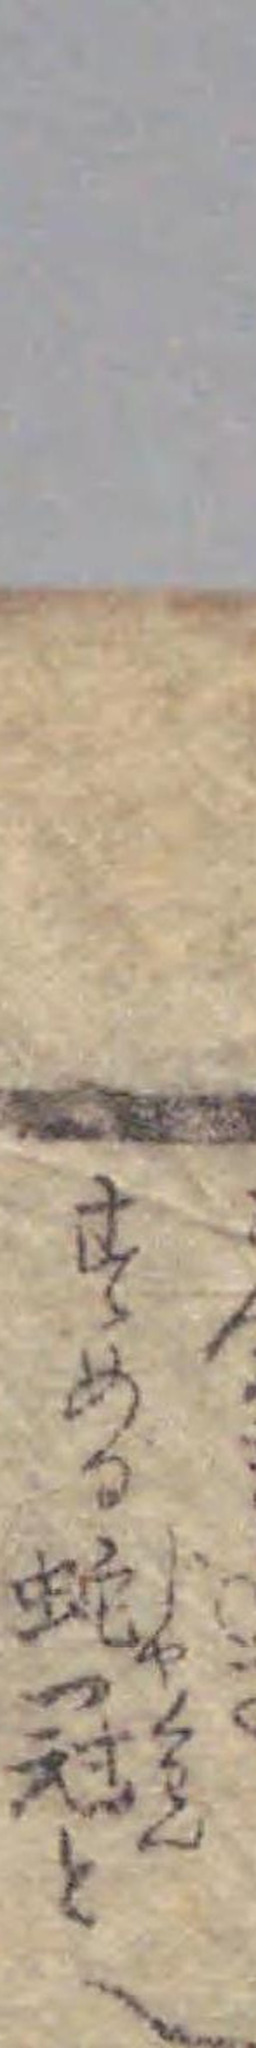すめる蛇冠と
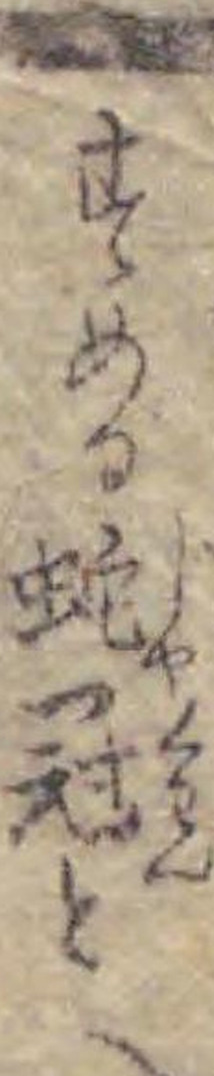すめる蛇冠と
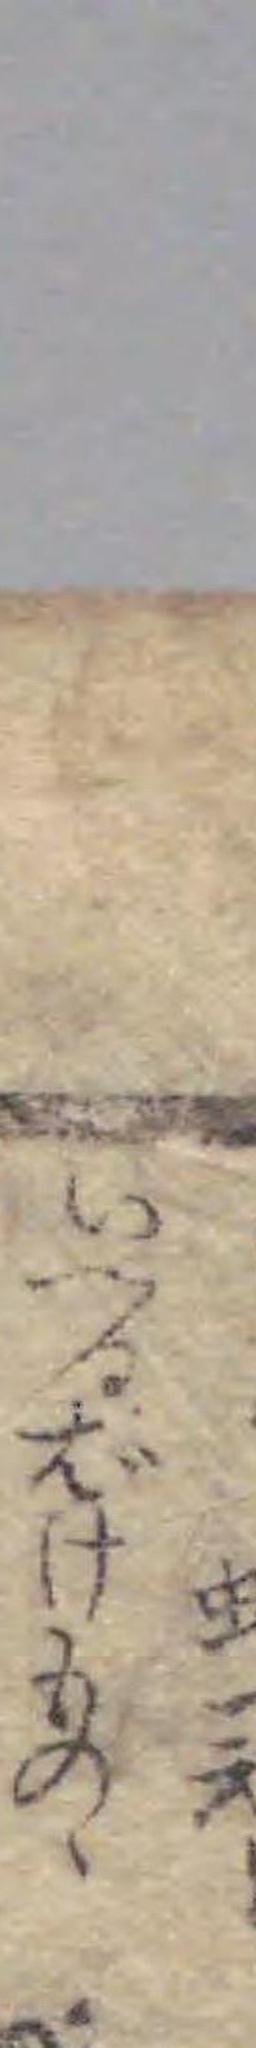いへるばけものゝ
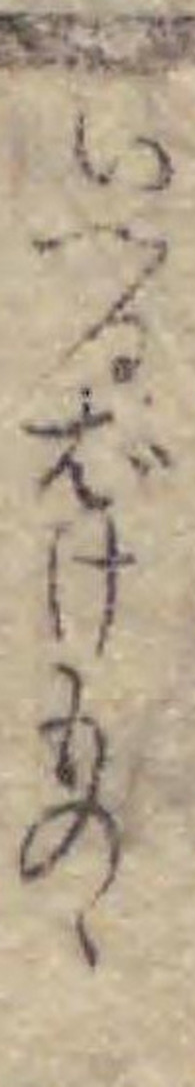いへるばけものゝ
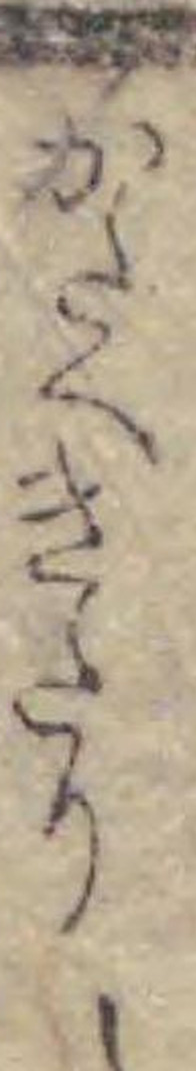かたへきたり
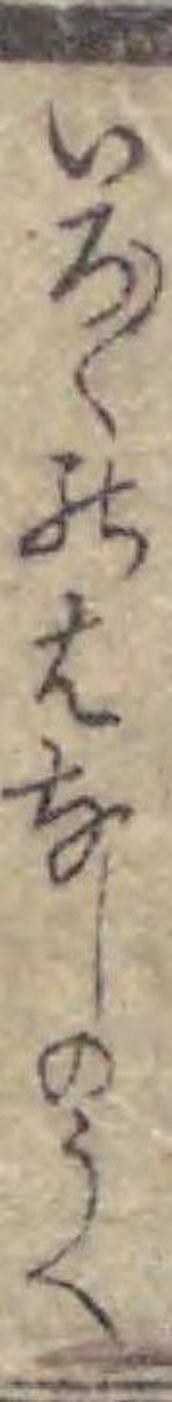いろ〳〵のはなしのうへ
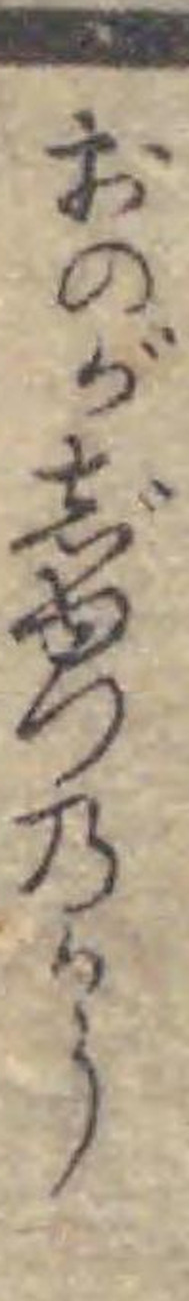おのがじゆつのかう
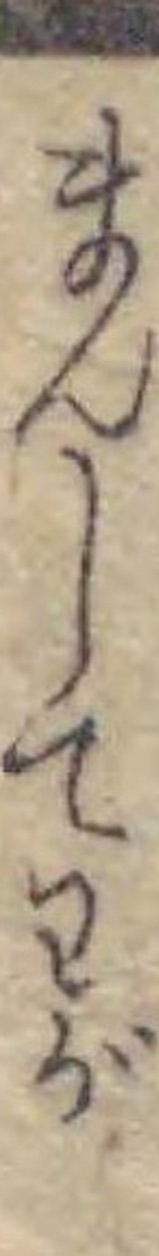まんしてわが
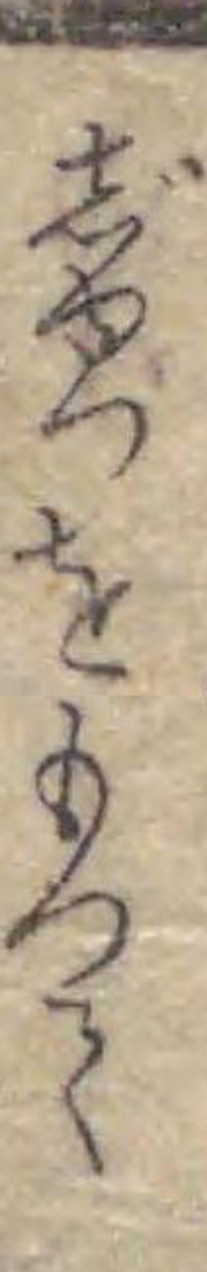じゆつをもつて
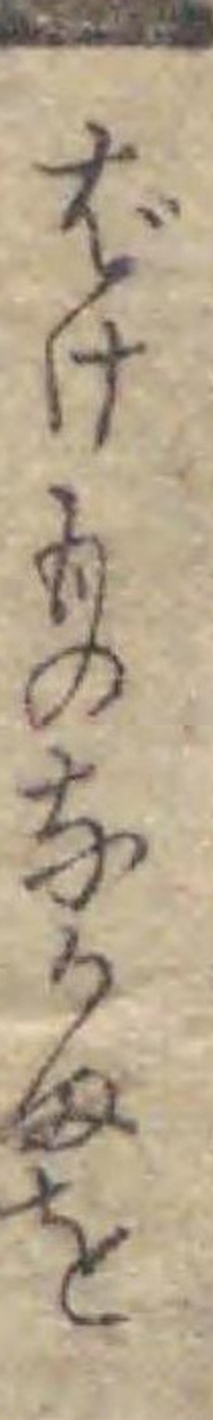ばけものなかまを
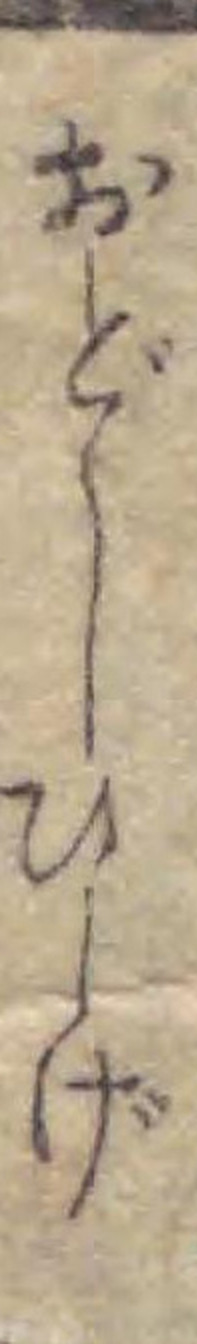おどしひしげ
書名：化物世界夜半嵐 : 3巻
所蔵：国立国会図書館 National Diet Library, JAPAN
